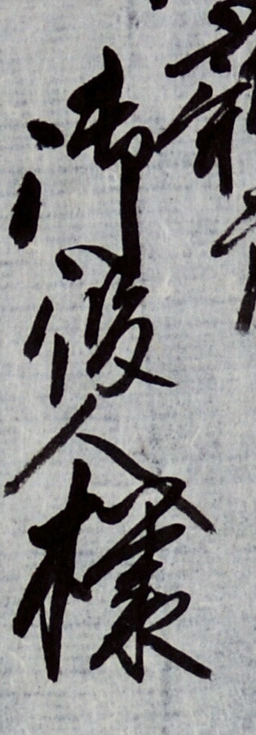御役人様
